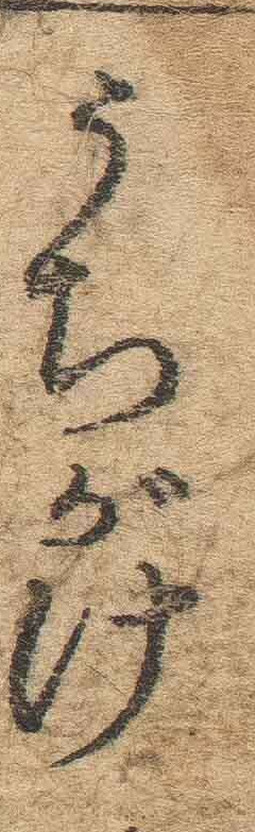うちかけ
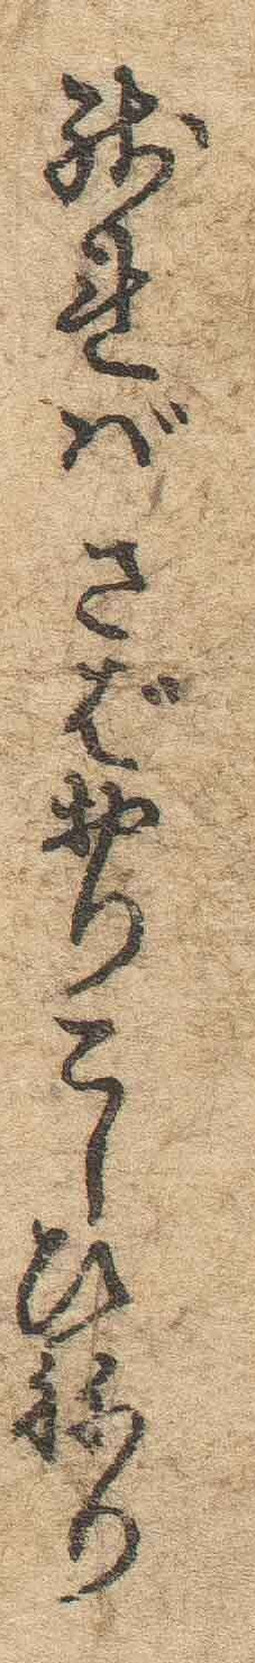残ればさばおりこしひねり
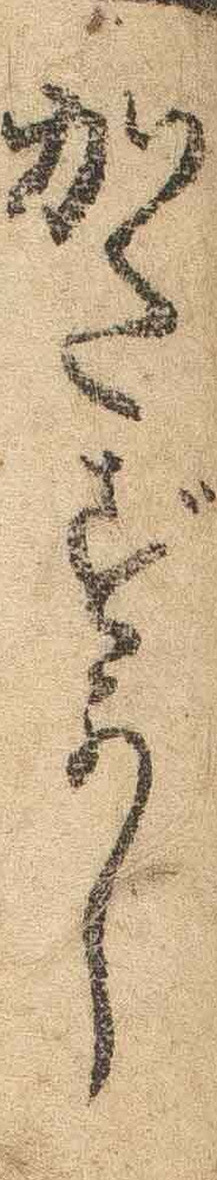かたずかし
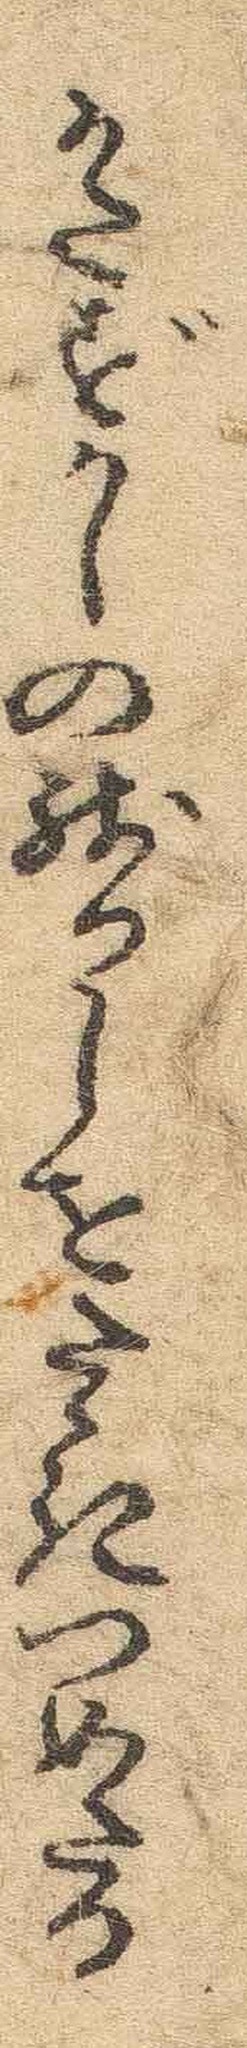かたずかしの残りしをたゝきつめたる
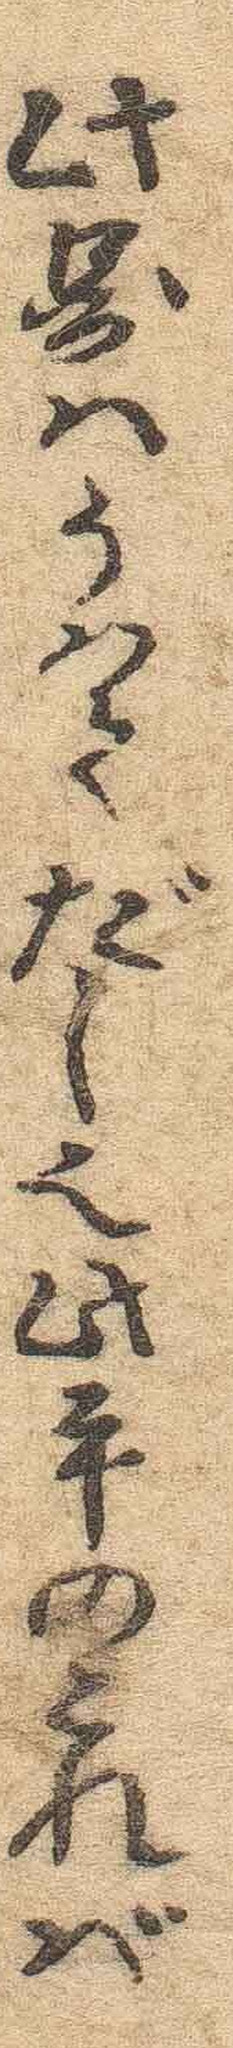此圖はうはてだし也此手のこれば
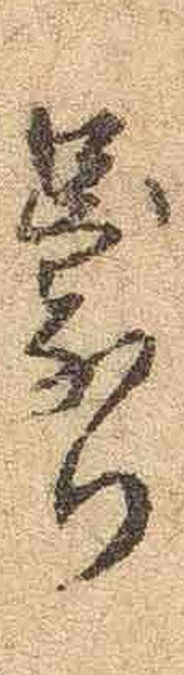圖なり
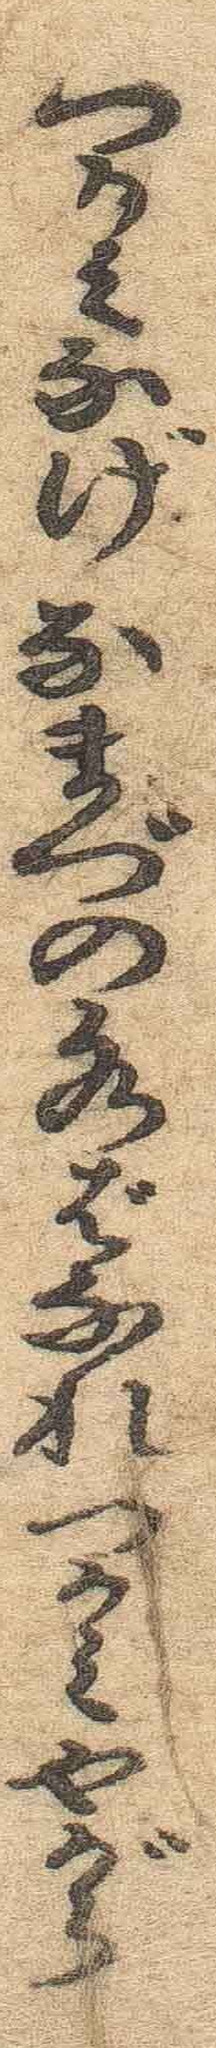つりはなげなまづの水ばなれつかみやがら

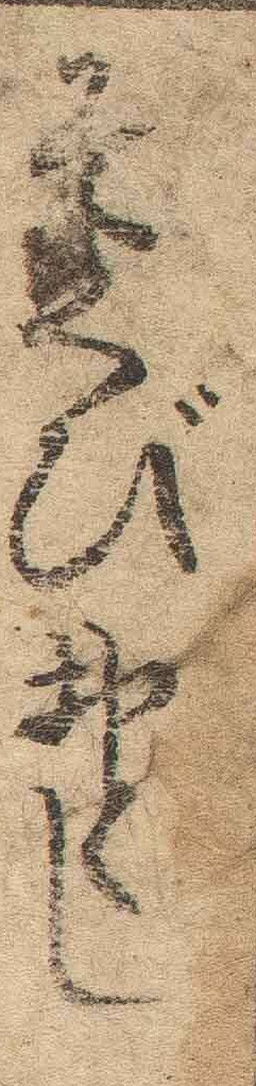そくびおとし
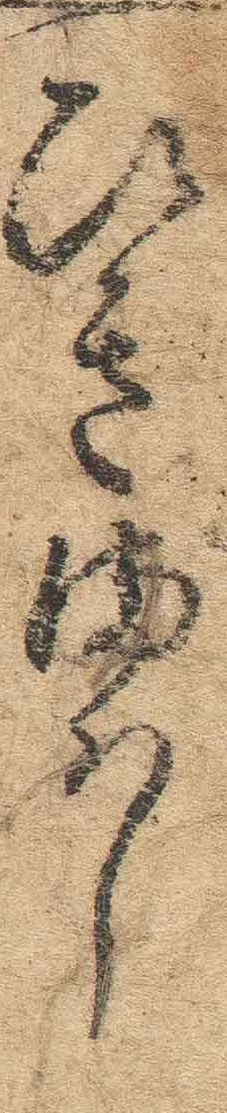ひきまはし
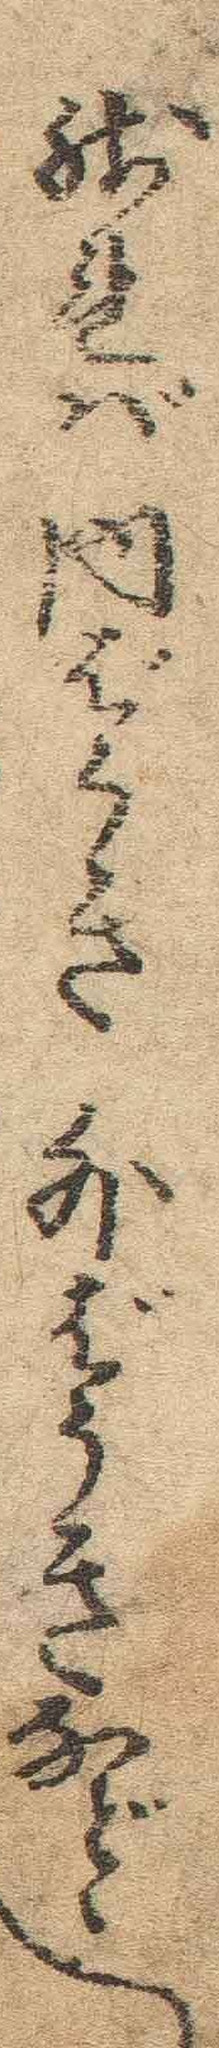然れば内ばうき外ばうきなど
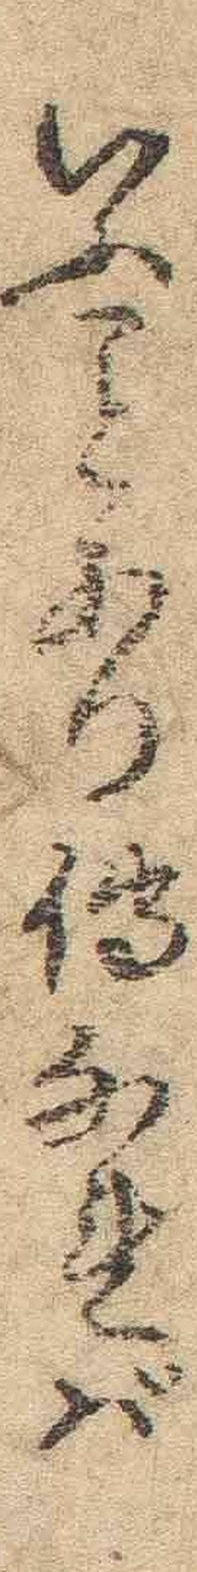いふことあり伝なれば
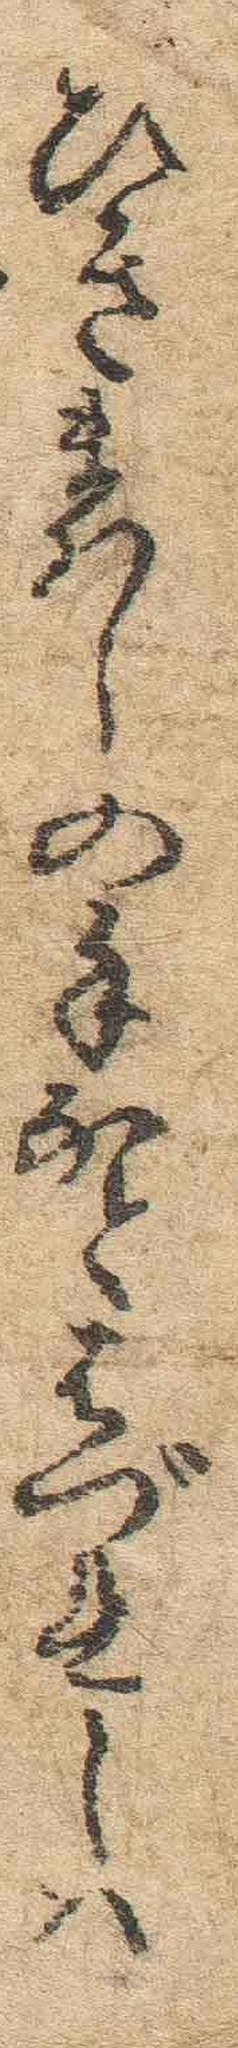ひきまはしの手などはづれしは
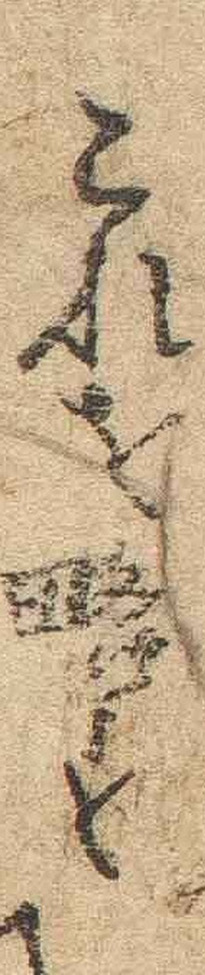これを略す
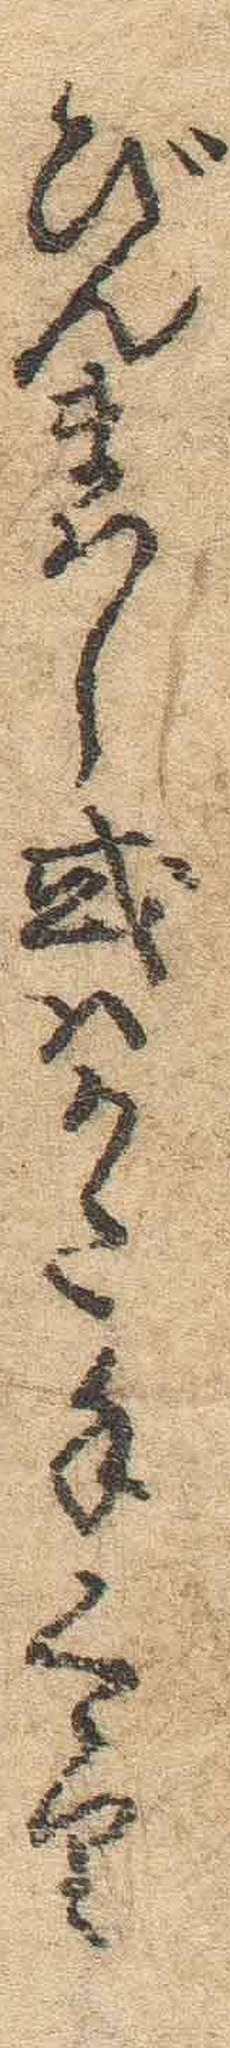びんまはし或はかたてくり
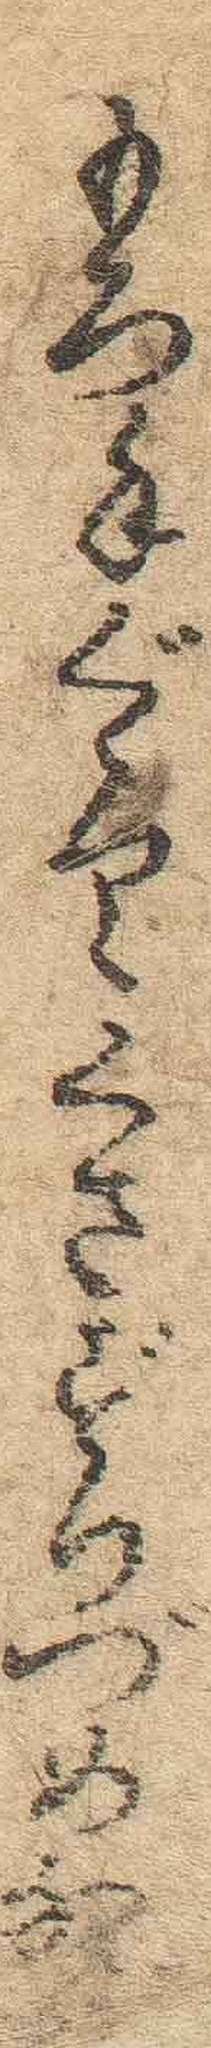もろてぐりくさずりづめなどになり
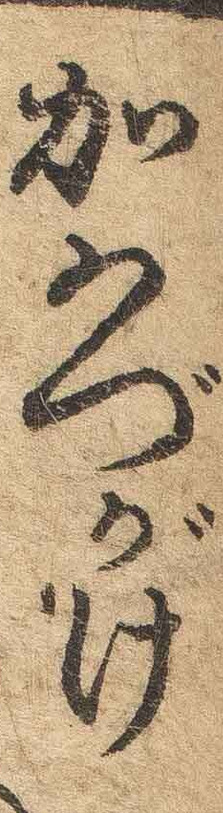かはづがけ
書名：古今相撲大全
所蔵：東京学芸大学附属図書館 国文学研究資料館
